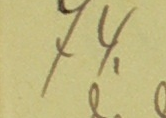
74
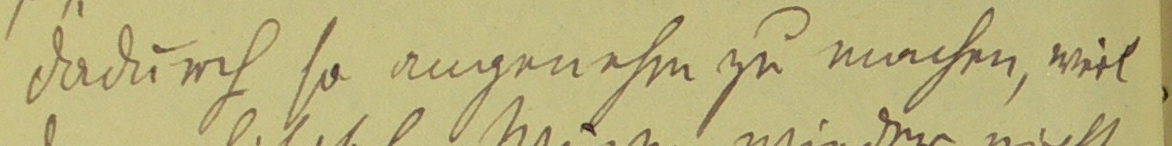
dadurch so angenehm zu machen, weil
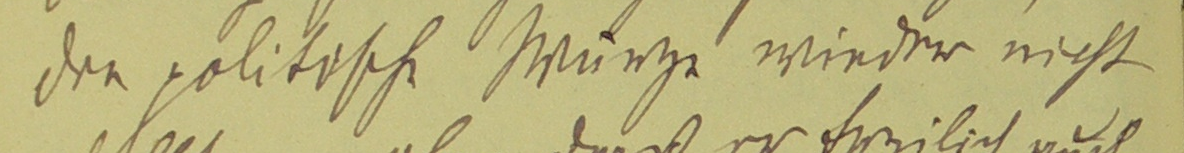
die politische Würze wieder nicht
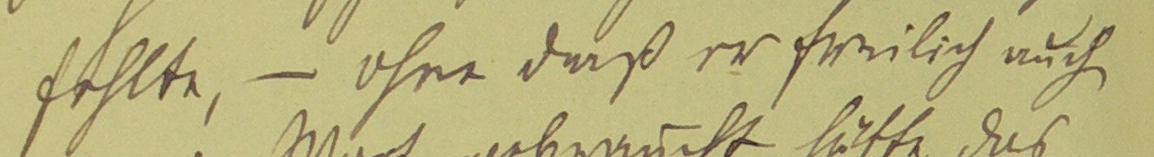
fehlte,-ohne das er freilich auch
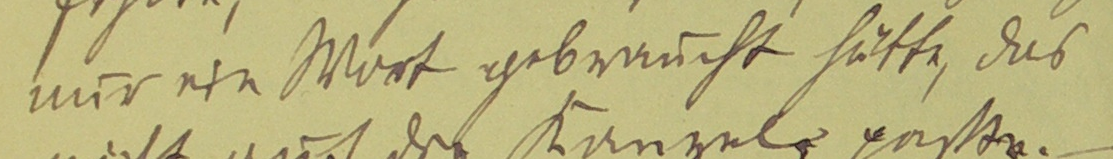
nur ein Wort gebraucht hätte das
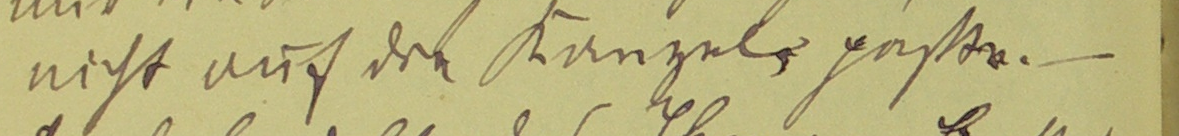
nicht auf die Kanzel paßte.-
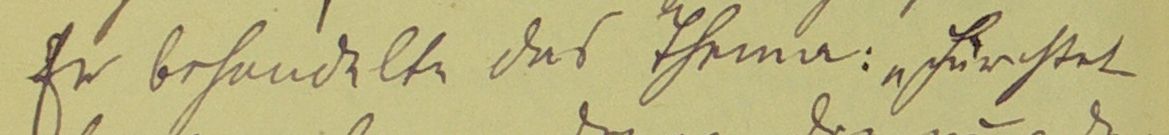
Er handelte das Thema. „Fürchtet
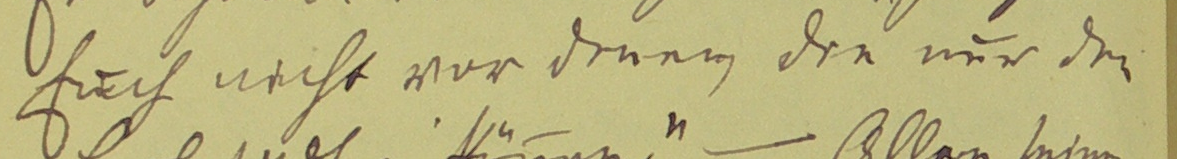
euch nicht vor denen die nur den
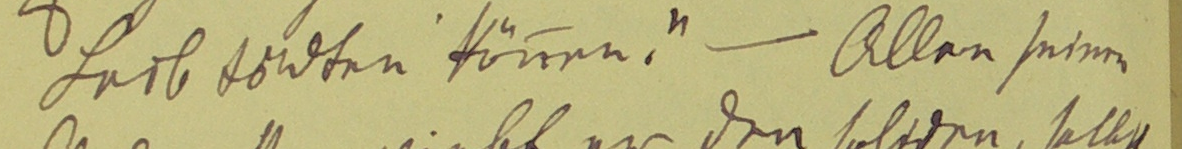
Leib töten können“.-- Allen seinen
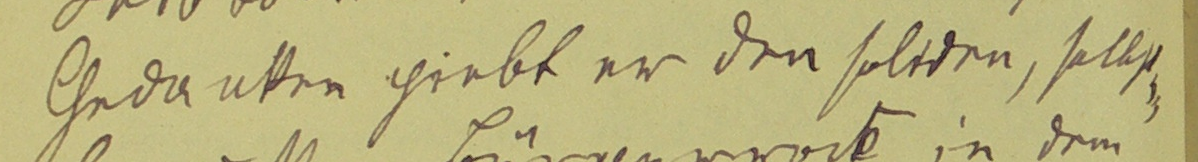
Gedanken giebt er den soliden, sel¬
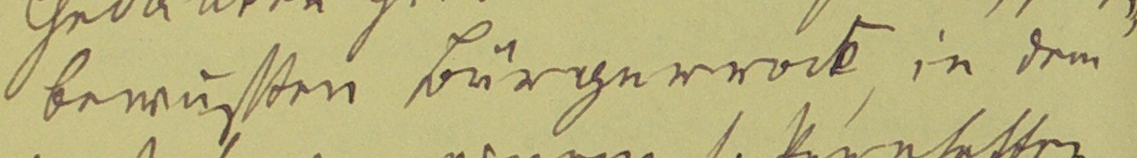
bstbewusten Bürgerrat, in dem
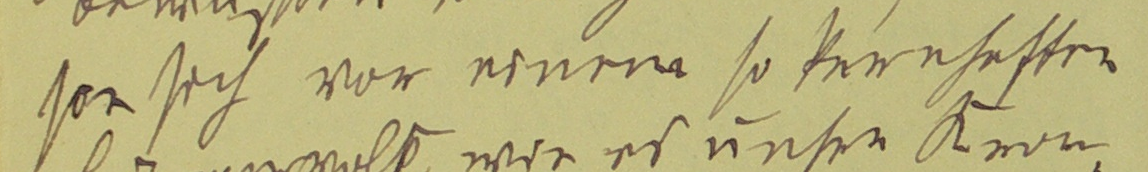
sie sich vor einem so kernhaften
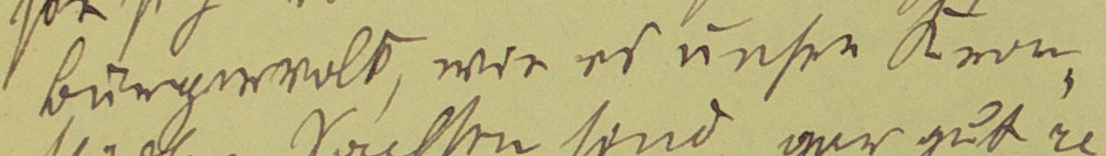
Bürgervolk, wie es unsere Kron¬
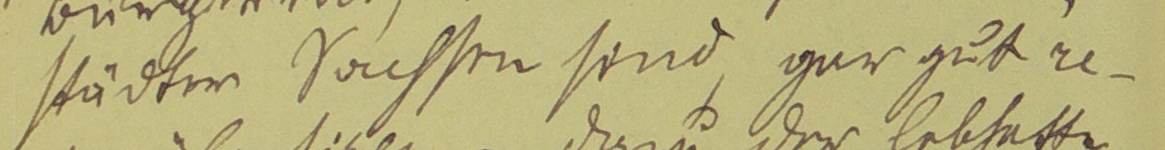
städter Sachsen sind, gar gut re¬
